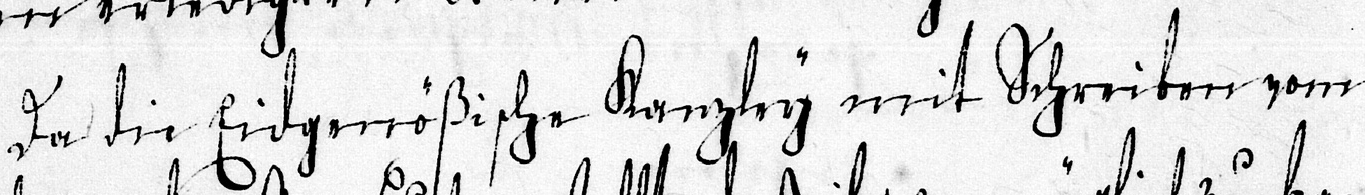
Da die Eidgenößische Kanzley mit Schreiben vom
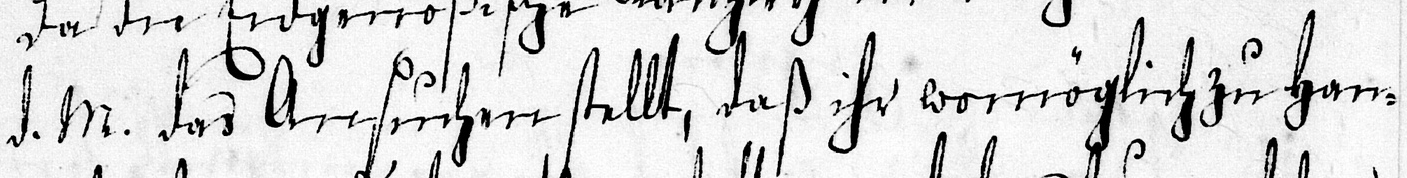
d. M. das Ansuchen stellt, daß ihr womöglich zu Han¬
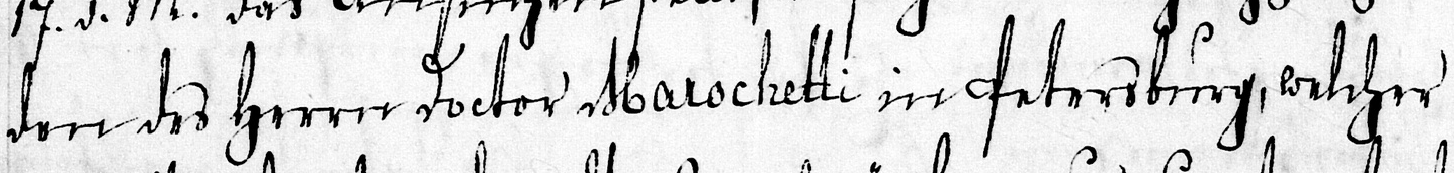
den des Herrn Doctor Marochetti in Petersburg, welcher
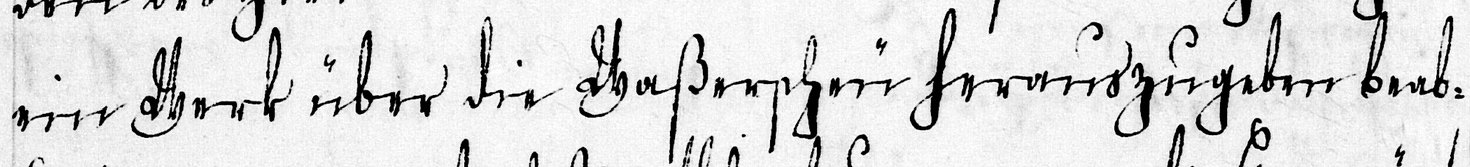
ein Werk über die Waßerscheu herauszugeben beab¬
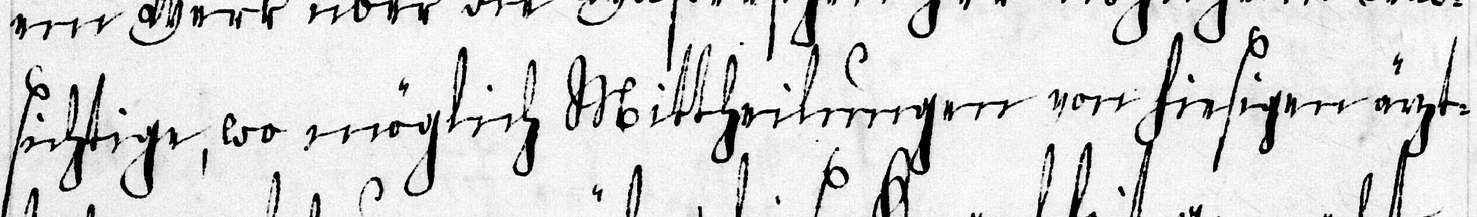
sichtige, wo möglich Mittheilungen von hiesigen ärzt¬
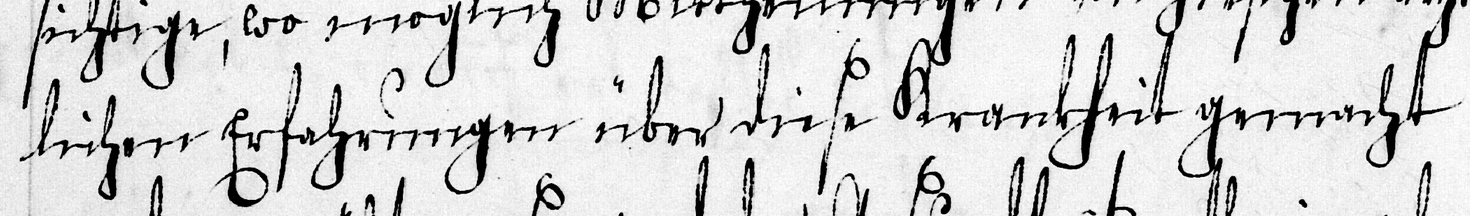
lichen Erfahrungen über diese Krankheit gemacht
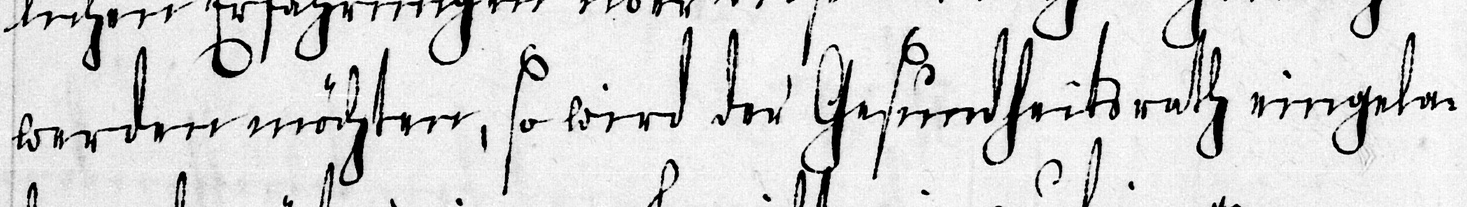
werden möchten, so wird der Gesundheitsrath eingela¬
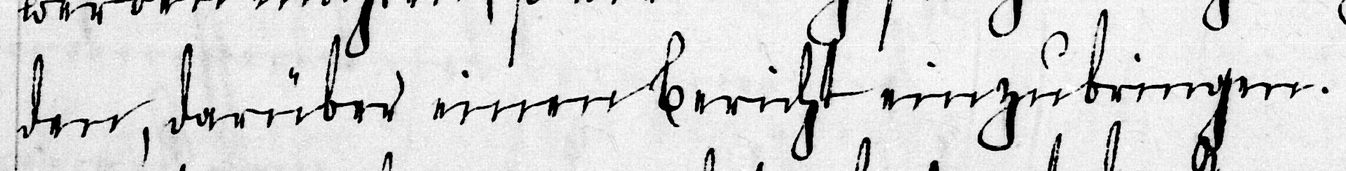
den, darüber einen Bericht einzubringen.
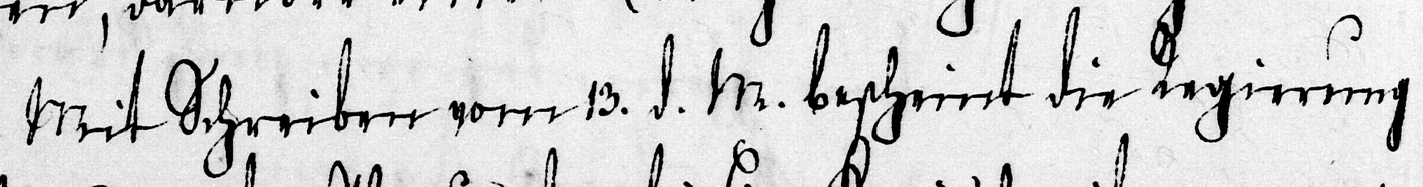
Mit Schreiben vom 13. d. M. bescheint die Regierung
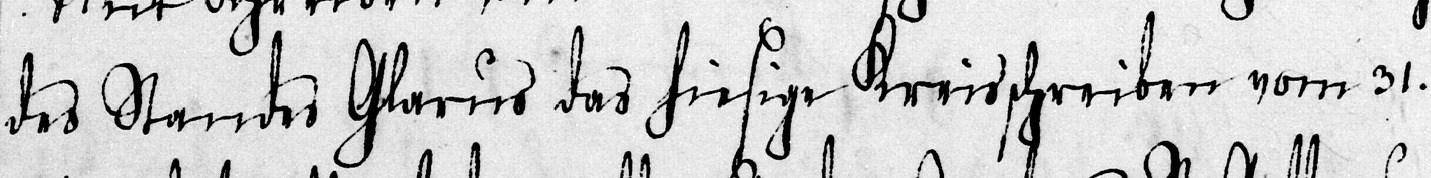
des Standes Glarus das hiesige Kreisschreiben vom 31.
